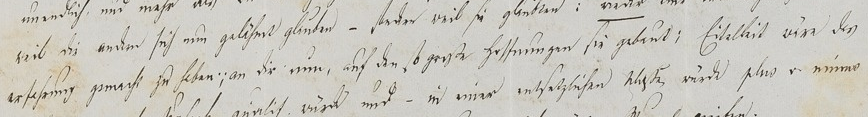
erscheinung gemacht zu haben; an dir nun, auf den so große Hoffnungen sie gebaut; Eitelkeit wäre das
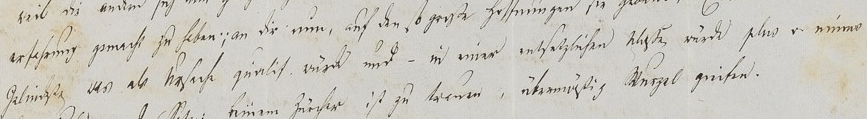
Gelindeste was als Ursache qualif. würde und in einer entsetzlichen Maße würde plus o. minus
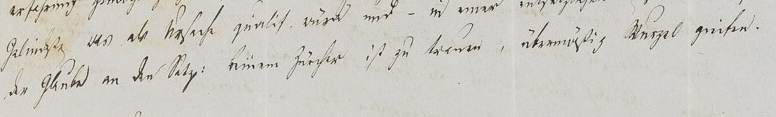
der Glaube an den Satze: keinem Zürcher ist zu trauen, übermäßig Wurzel greifen.
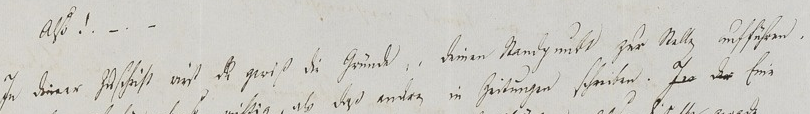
In dieser Zuschrift wirst du gewiß die Gründe, deinen Standpunkt zur Stelle aufführen.
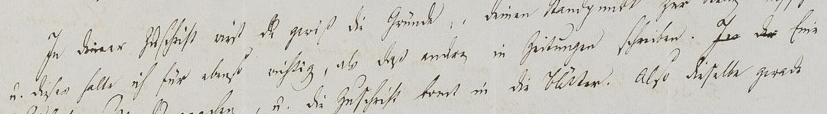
u. dieses halte ich für ebenso wichtig, als daß andere in Zeitungen schreiben. In der Eine
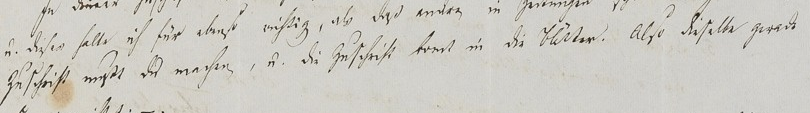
Zuschrift mußt du machen, u. die Zuschrift komt in die Blätter. Also dieselbe gerade
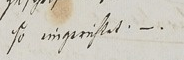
so eingerichtet. –
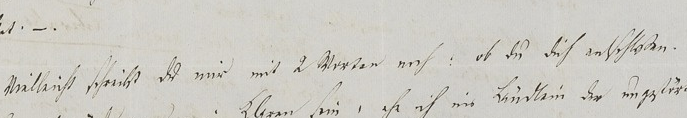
Vielleicht schreibst du mir mit 2 Worten noch: ob du dich entschlossen.
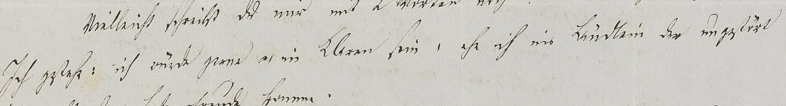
Ich gestehe: ich würde gerne im Klaren sein, ehe ich ins Ländlein der ungestört
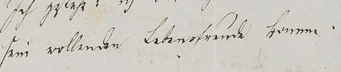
sein wollenden Lebensfreude komme.
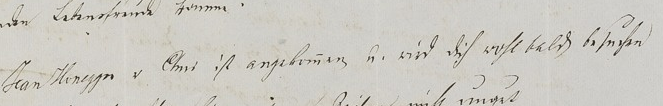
Jean Honegger v. Chur ist angekommen u. wird dich wohl bald besuchen.
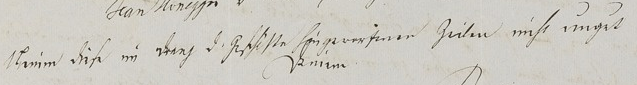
Nimm diese im Drang d Geschäfte hingeworfenen Zeilen nicht ungut
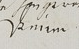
Deinem
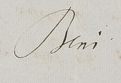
Beni.
